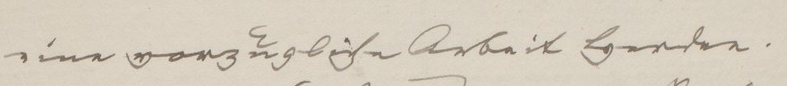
eine vorzügliche Arbeit werden.
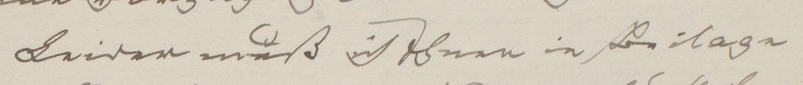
Leider muß ich Ihnen in Beilage
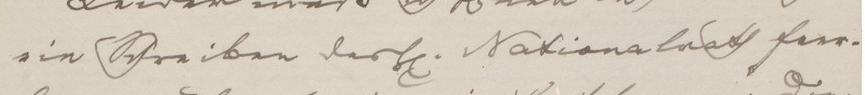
ein Schreiben des H. Nationalrath Feer–
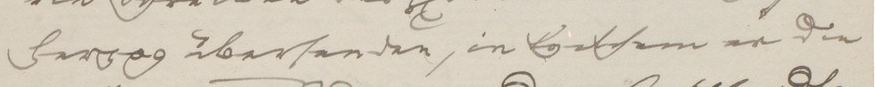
Herzog übersenden, in welchem er die
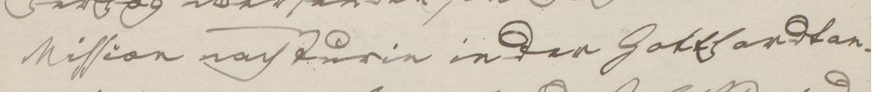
Mission nach Turin in der Gotthardtan-
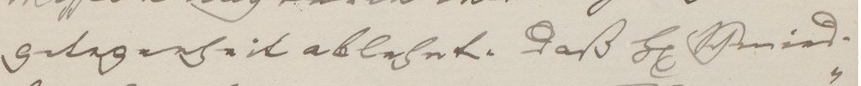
gelegenheit ablehnt. Daß H Schmied-
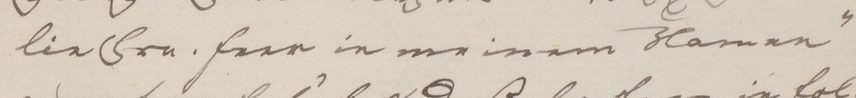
lin Hrn. Feer «in meinem Namen»
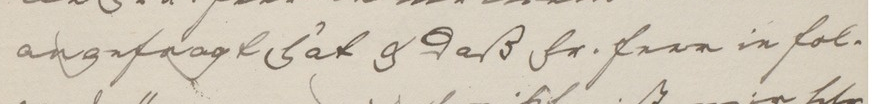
angefragt hat & daß Hr. Feer in Fol-
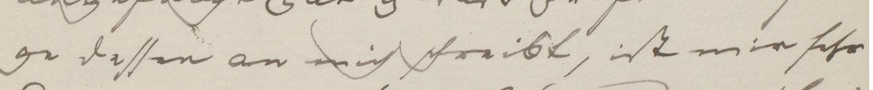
ge dessen an mich schreibt, ist mir sehr
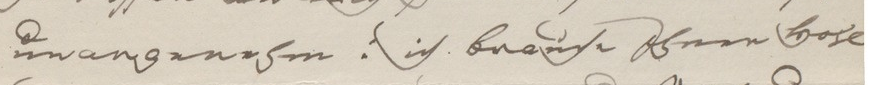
unangenehm: ich brauche Ihnen wohl
